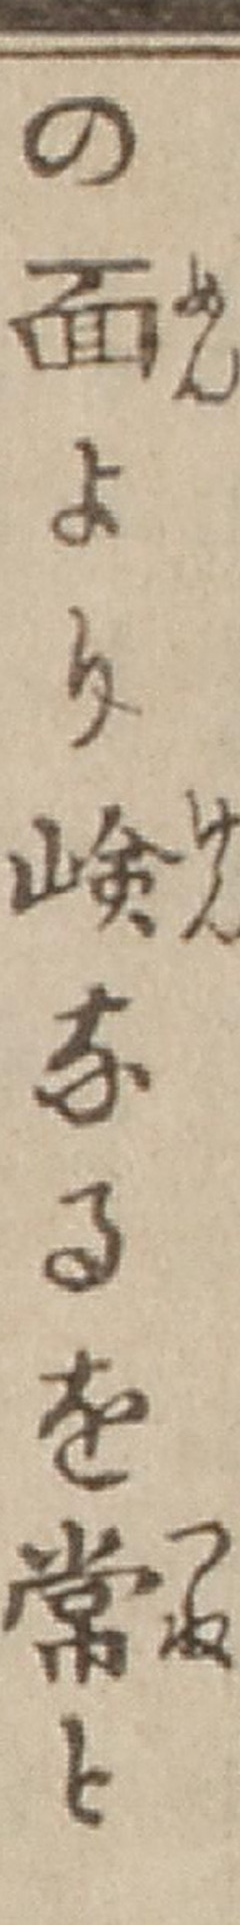の面より嶮なるを常と
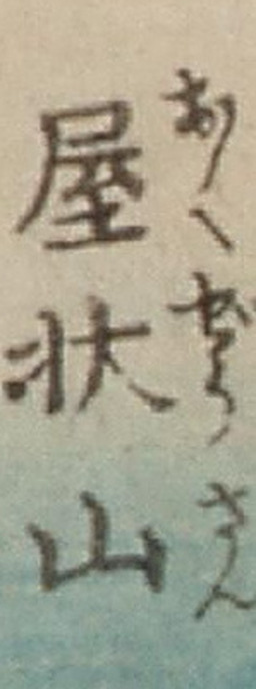屋状山
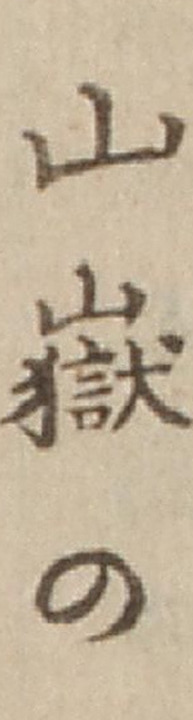山嶽の
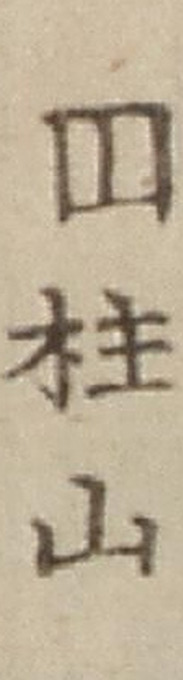円柱山
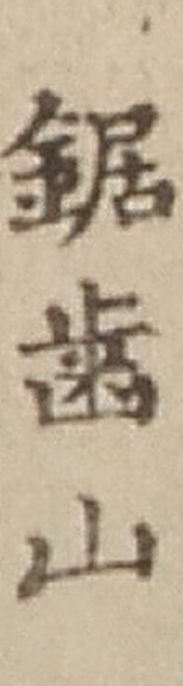鋸歯山
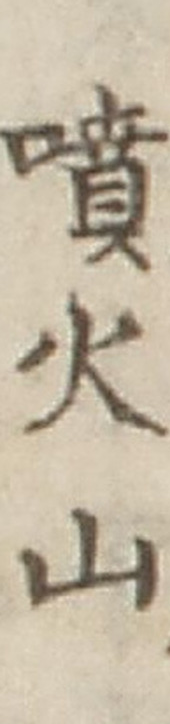噴火山

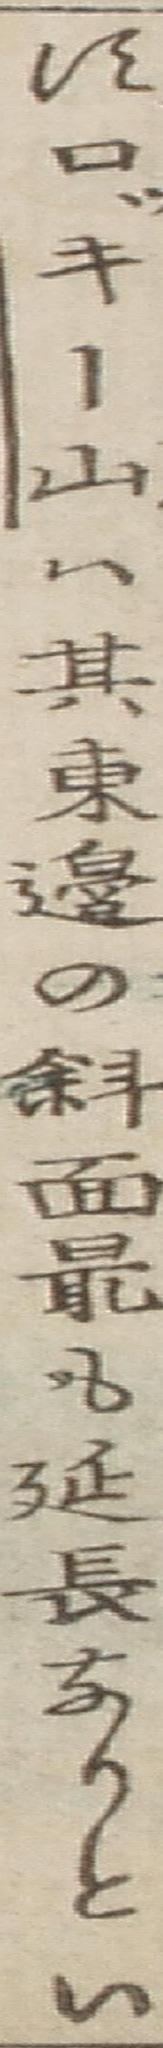す、ロッキー山は其東辺の斜面最も延長なりとい
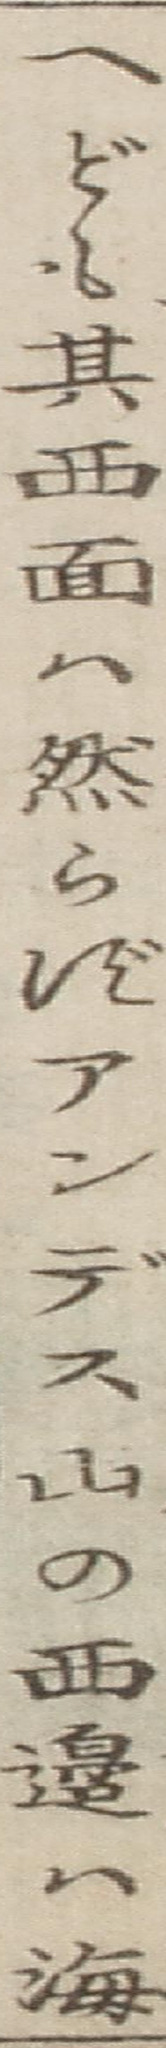へども、其西面は然らず、アンデス山の西辺は海
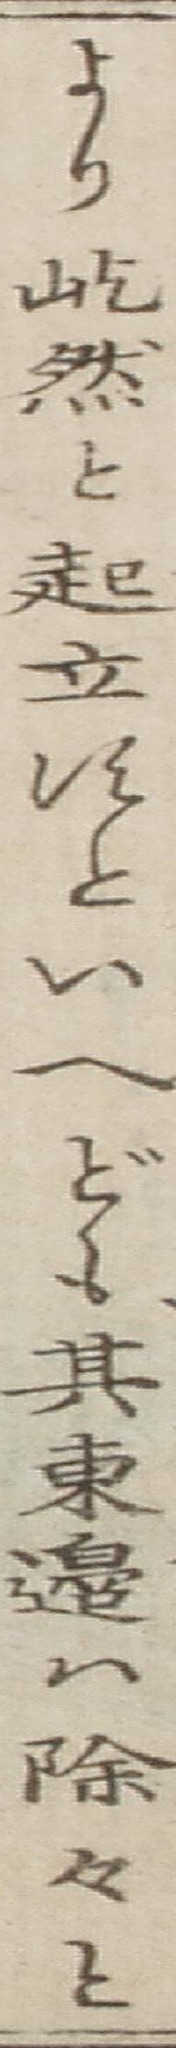より屹然と起立すといへども、其東辺は除々と
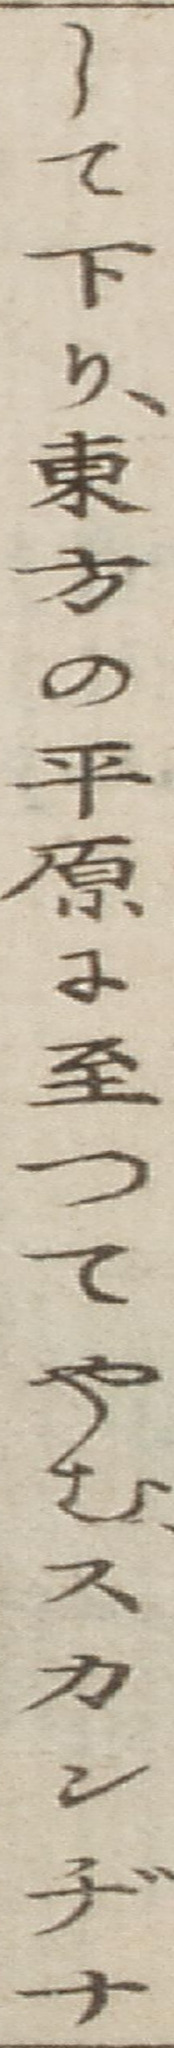して下り、東方の平原に至つてやむ、スカンヂナ
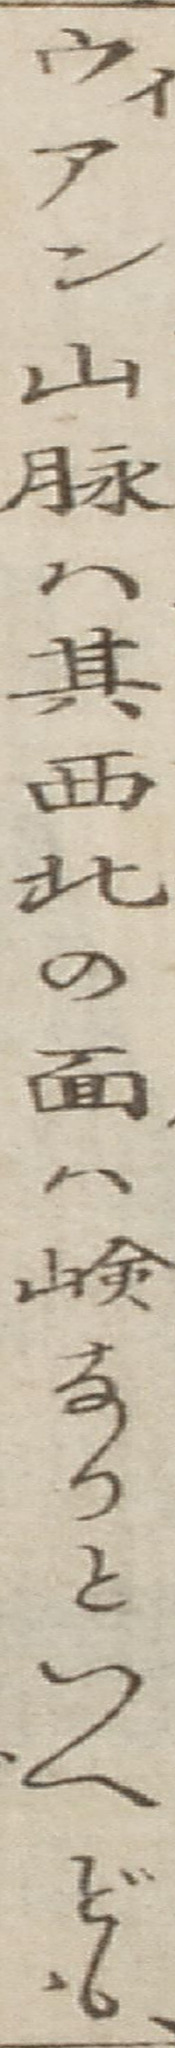ウィアン山脈は、其西北の面は嶮なりといへども、
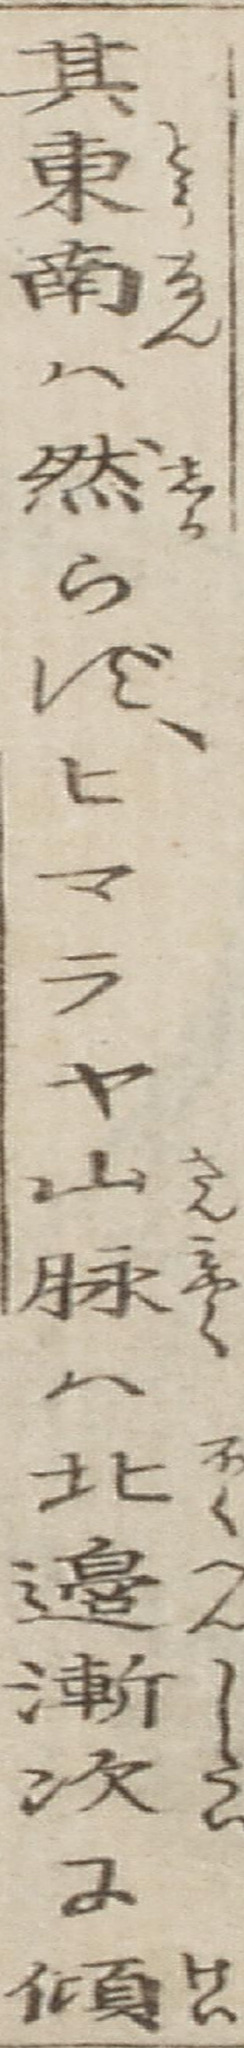其東南は然らず、ヒマラヤ山脈は北辺漸次に傾
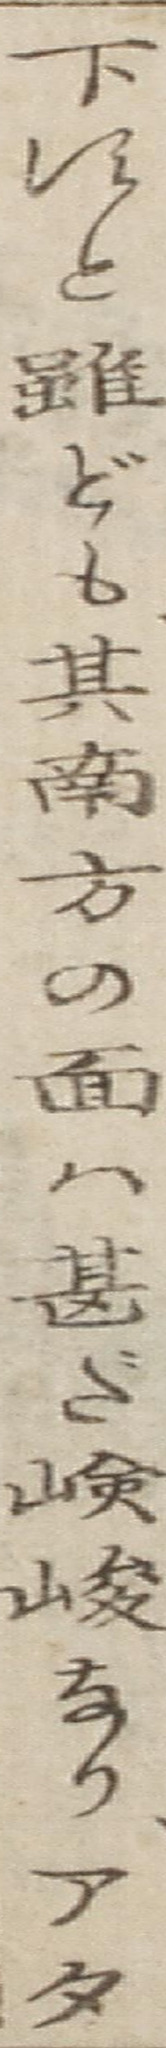下すと雖ども、其南方の面は甚だ嶮峻なり、アタ
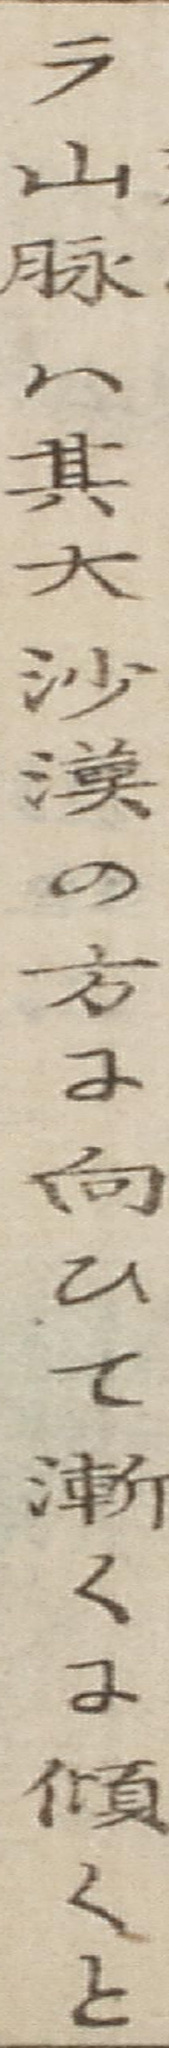ラ山脈は其大沙漠の方に向ひて、漸くに傾くと
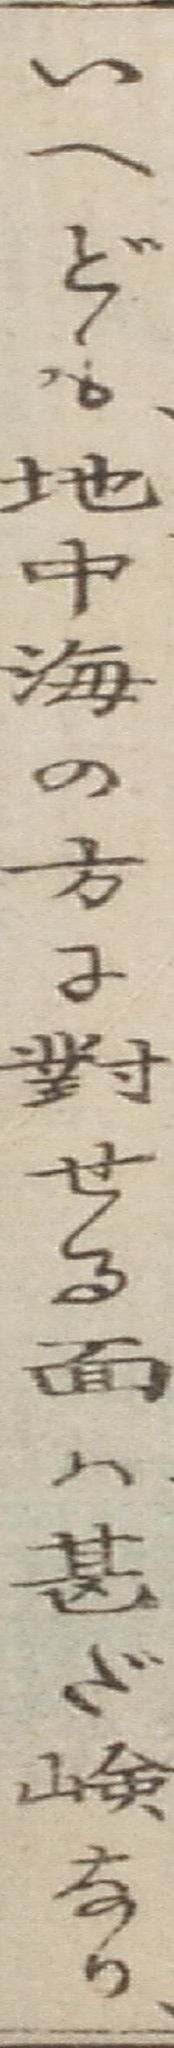いへども、地中海の方に対せる面は、甚だ嶮なり、
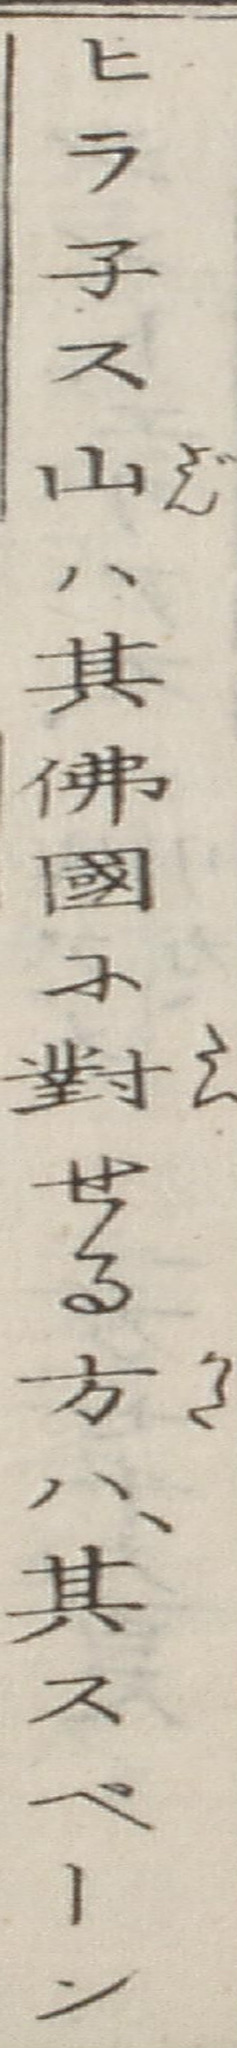ヒラネス山は其仏国に対せる方は、其スペーン
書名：訓蒙　天然地理學　上
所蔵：東京大学地震研究所図書室 Earthquake Research Institute Library, The University of Tokyo, JAPAN
